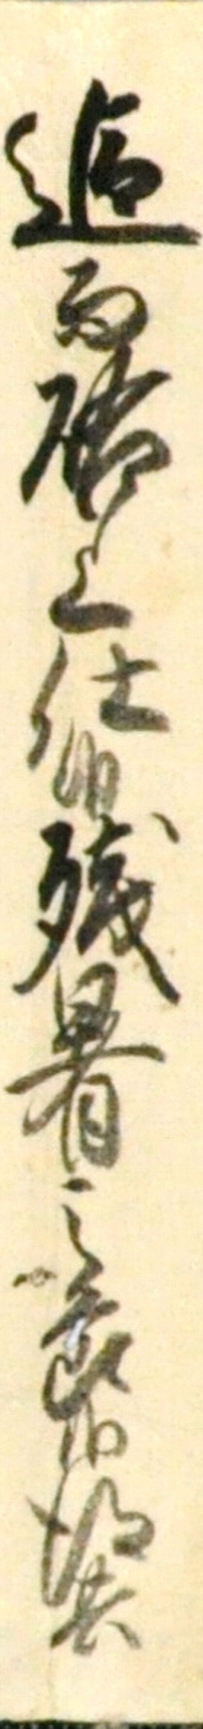追而啓上仕候残暑之節候得共
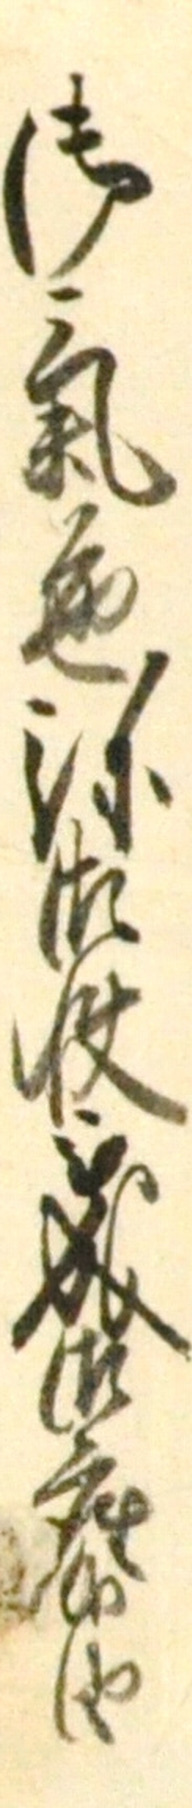御気色弥御快被成御座候由
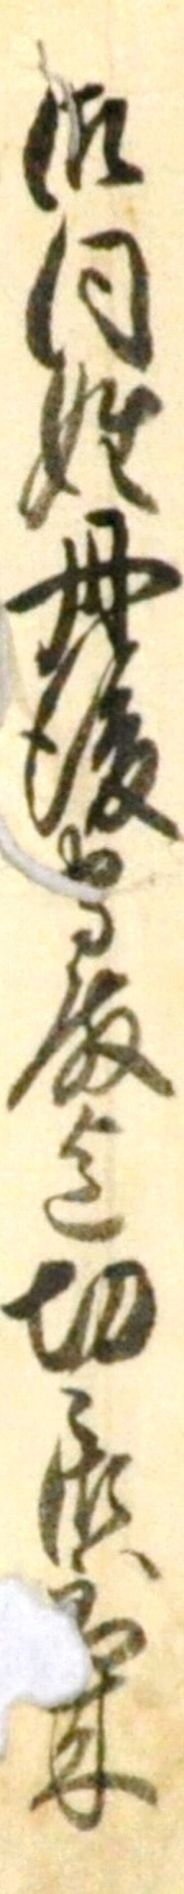御同姓丹波守殿迄切々御到来
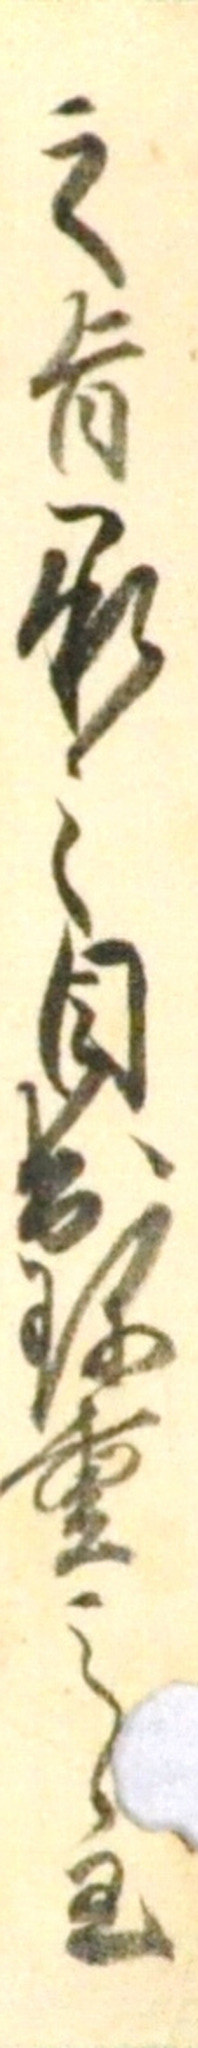之旨承之目出珍重之至
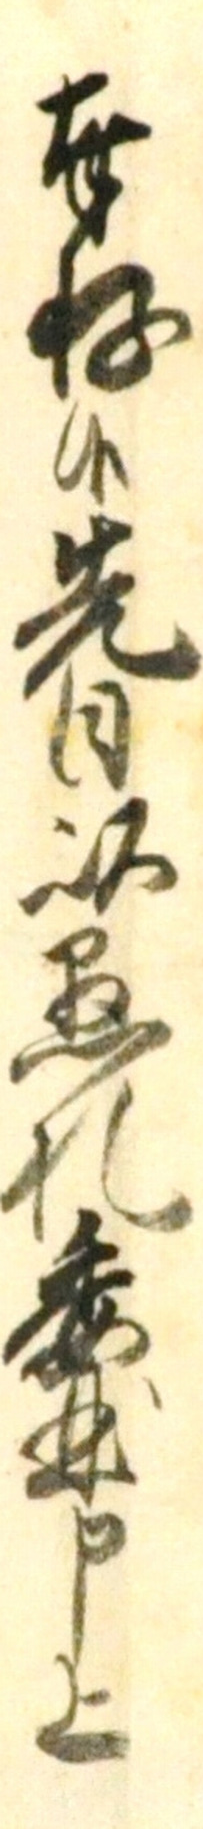奉存候先日以愚札委曲申上
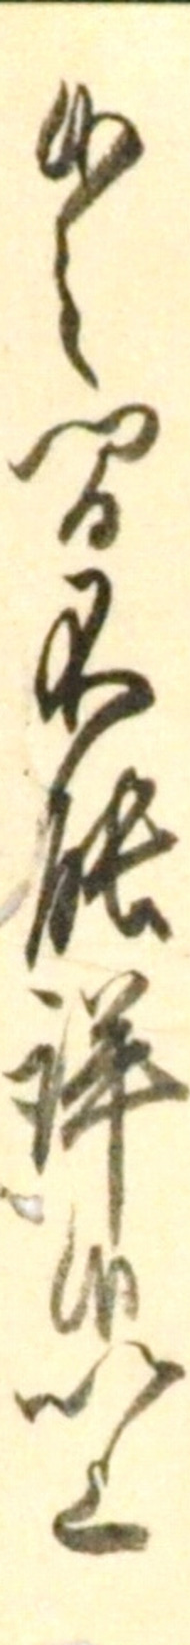候之間不能詳候以上
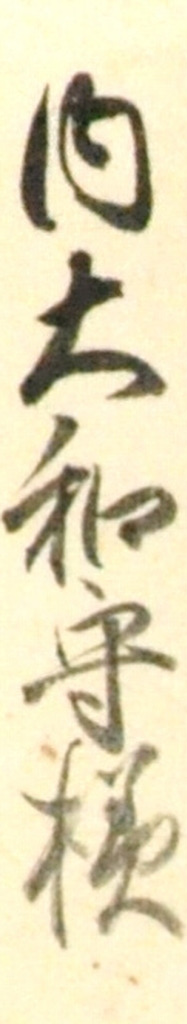内大和守様
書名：書状
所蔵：伊那市立高遠町図書館・合同会社AMANE
